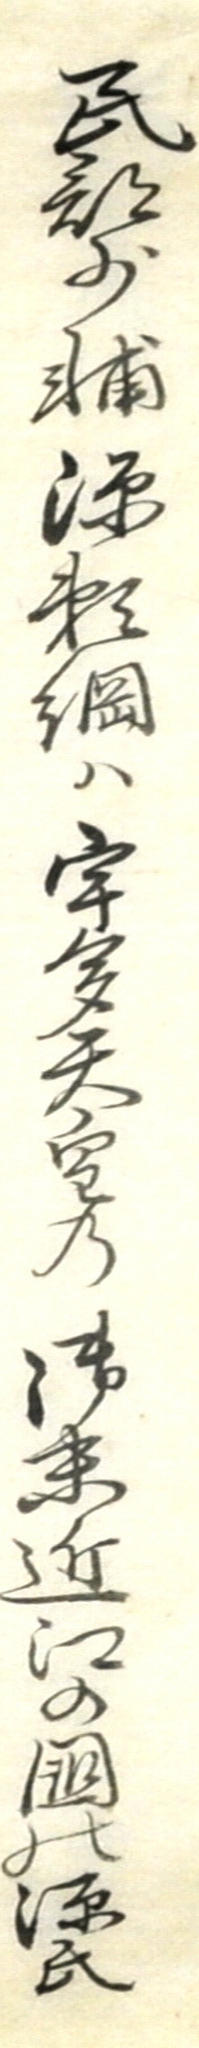民部少輔源頼綱は宇多天皇の御末近江の国の源氏
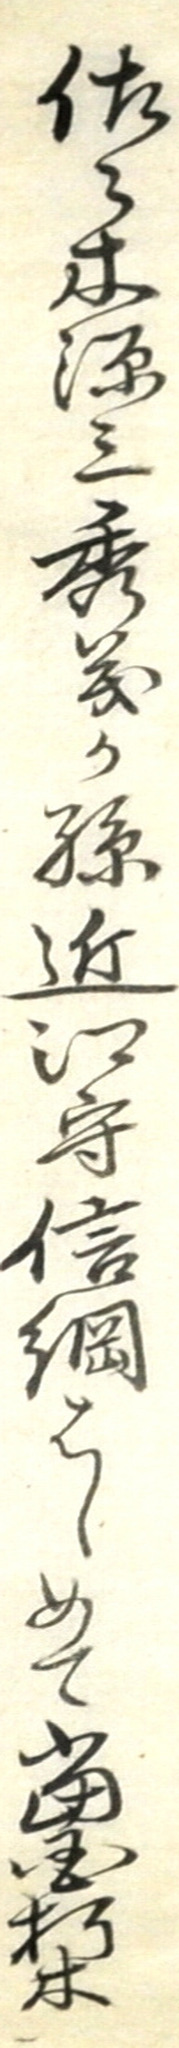佐々木源三秀義か孫近江守信綱はしめて当国朽木
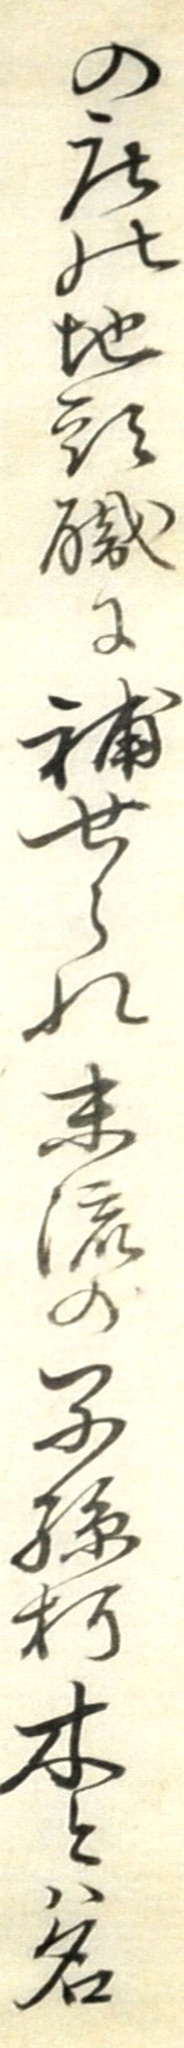の庄の地頭職に補せられ末流の子孫朽木とは名
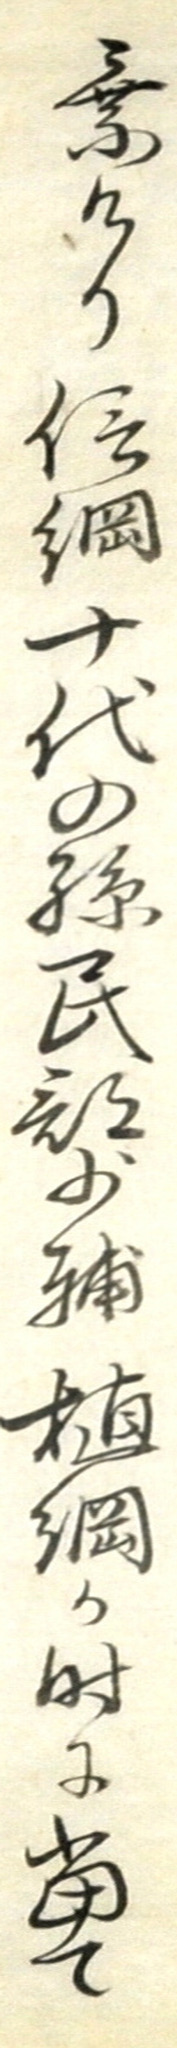乗けり信綱十代の孫民部少輔植綱か時に当て
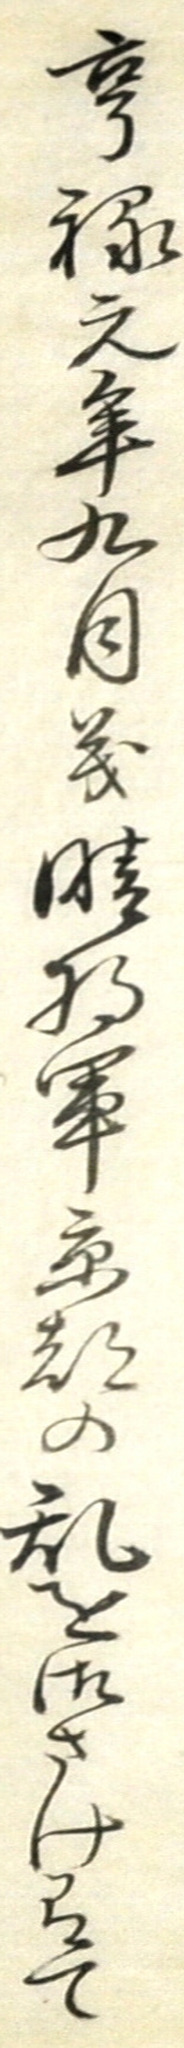享禄元年九月義晴将軍京都の乱を御さけ有て
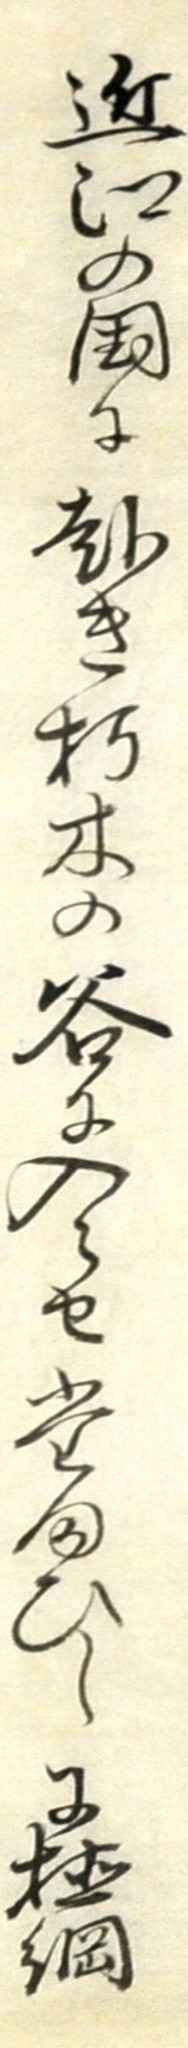近江の国に赴き朽木の谷に入らせたまひしに植綱
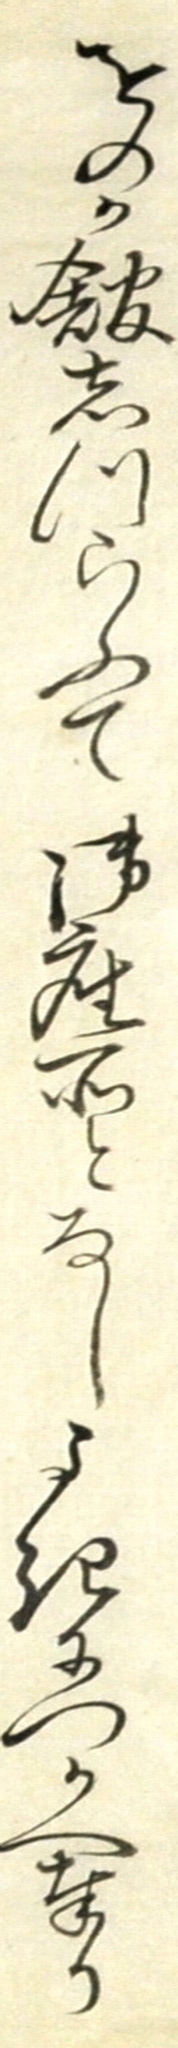をのか館しつらふて御座所となしよきにつかへ奉り
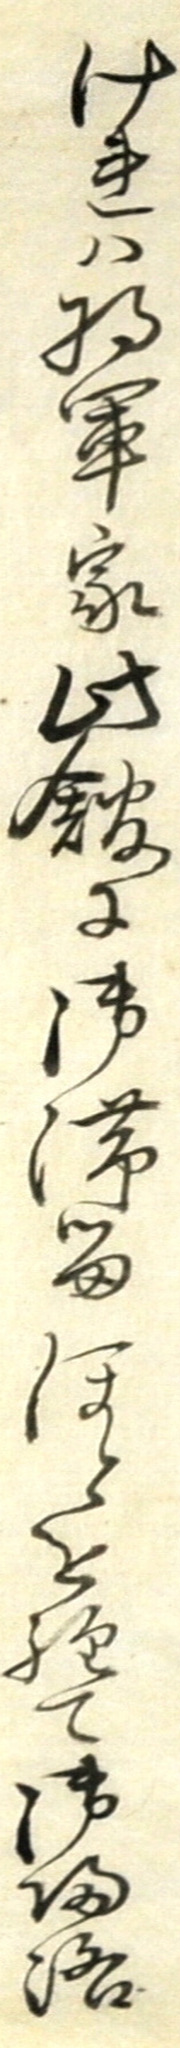けれは将軍家此館に御滞留ほとを経て御帰洛
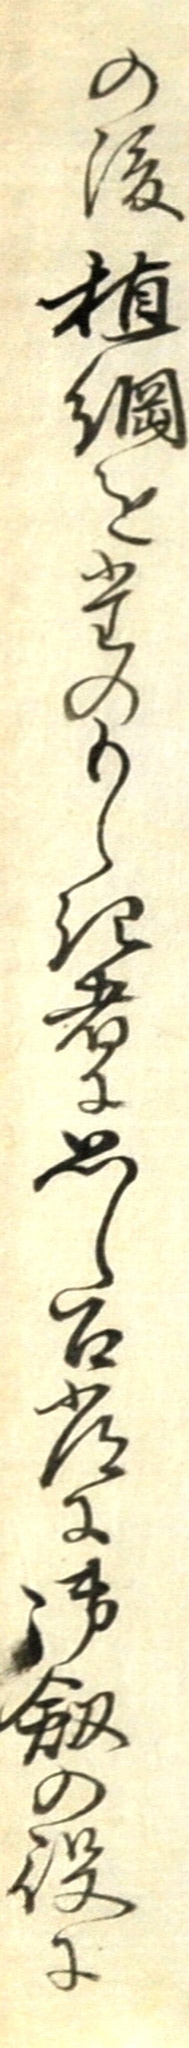の後植綱をたのもしき者に思し召常に御剣の役に

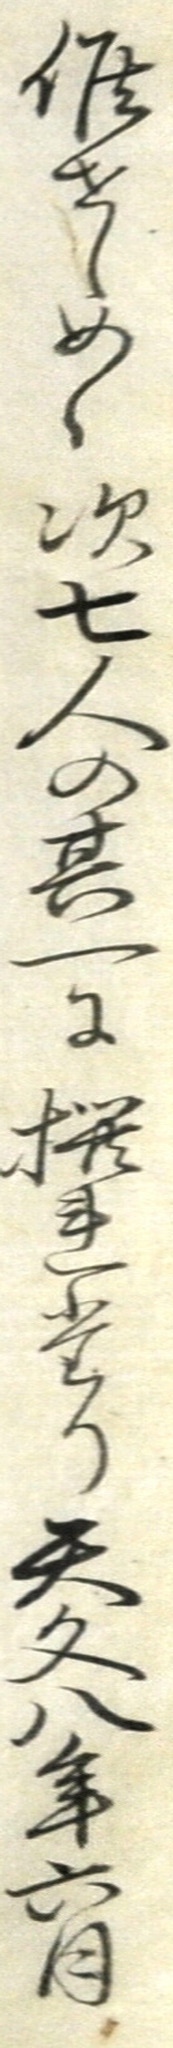候せしめし次七人の其一に撰れたり天文八年六月
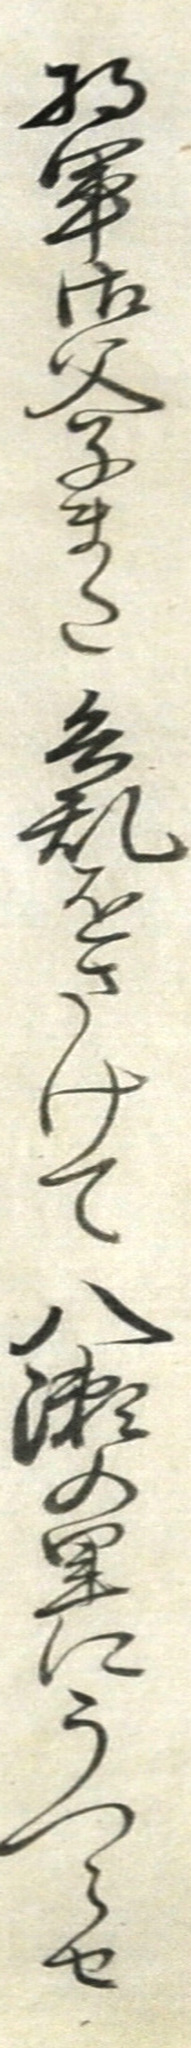将軍御父子また兵乱をさけて八瀬の里にうつらせ
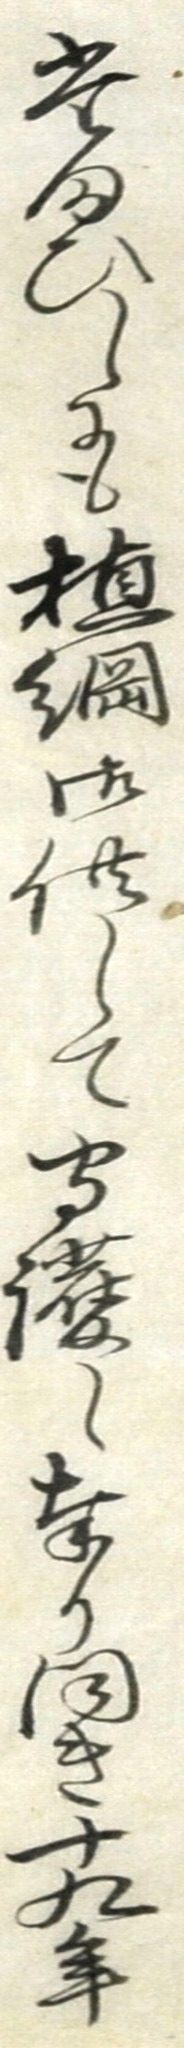たまひしにも植綱御供して守護し奉り同き十九年
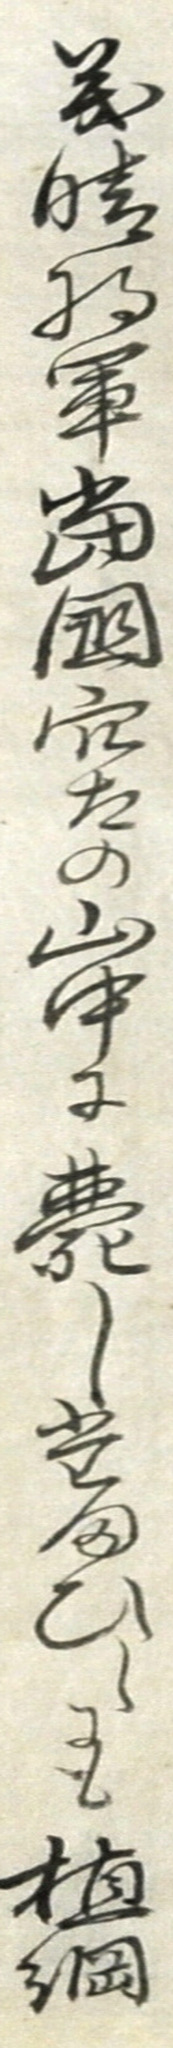義晴将軍当国穴太の山中に薨したまひしにも植綱
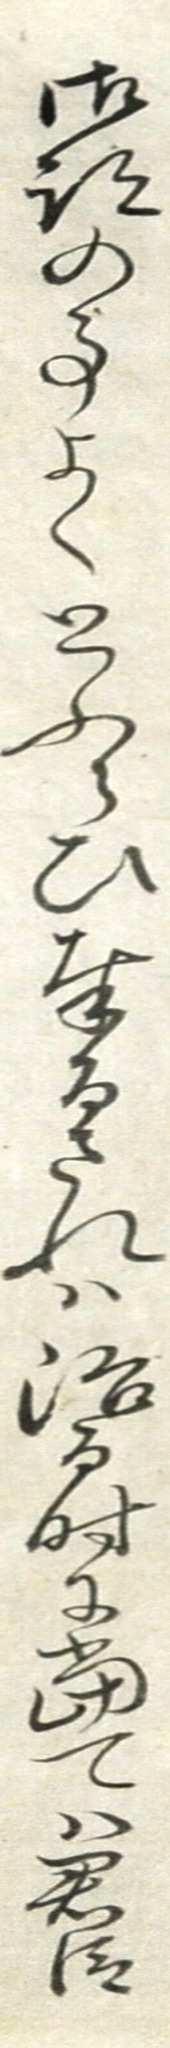御跡の事よくとふらひ奉るされは治る時に当たは君臣
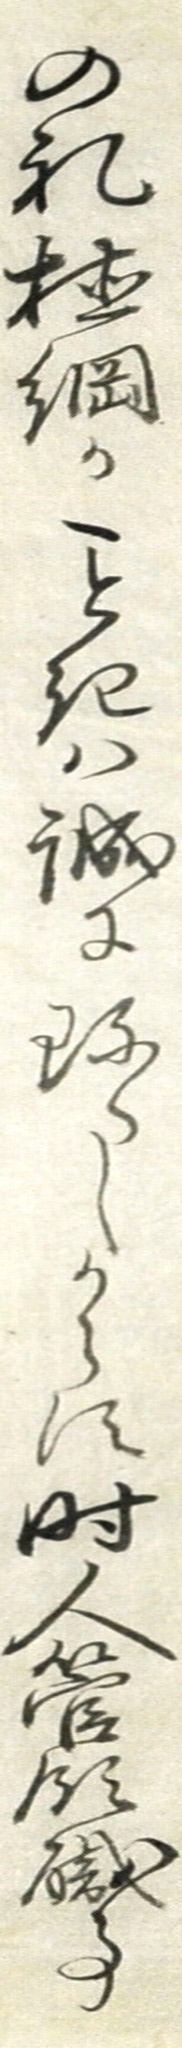の礼植綱かこときは誠に珍らしからす時人管領職事
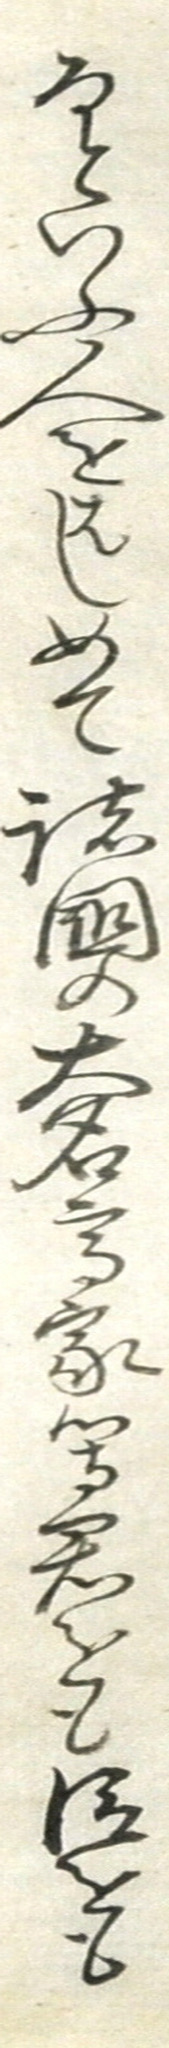なといふ人をはしめて諸国の大名高家等君をも臣をも
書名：藩翰譜（六）
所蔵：伊那市立高遠町図書館・合同会社AMANE
